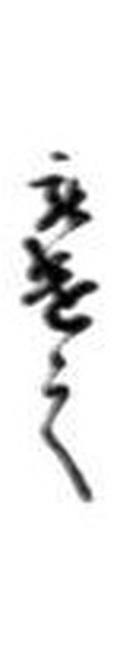被遣之
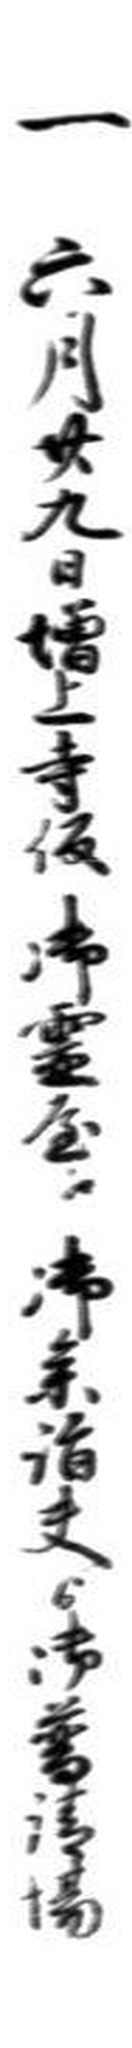一六月廿九日増上寺仮御霊屋江御参詣夫ゟ御普請場
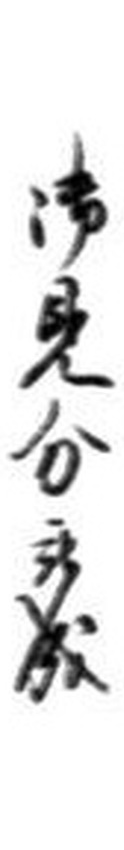御見分被成
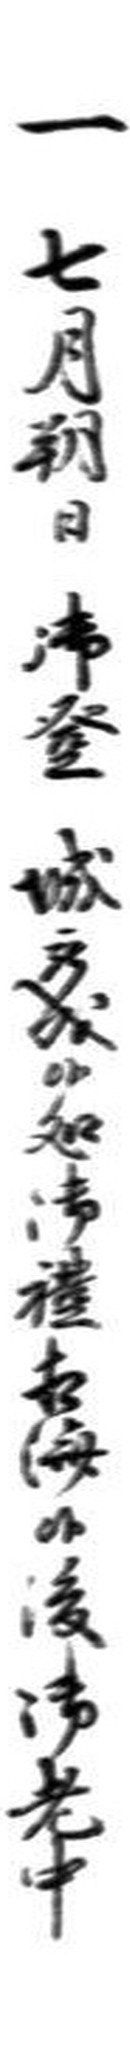一七月朔日御登城被成候処御礼相済候後御老中
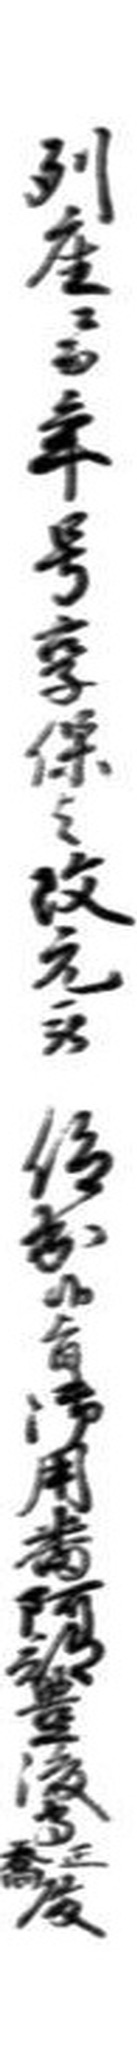列座ニ而年号享保と改元被仰出候旨御用番阿部豊後守正喬殿
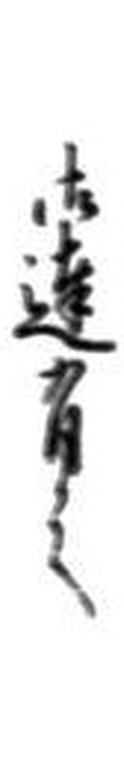御達有之
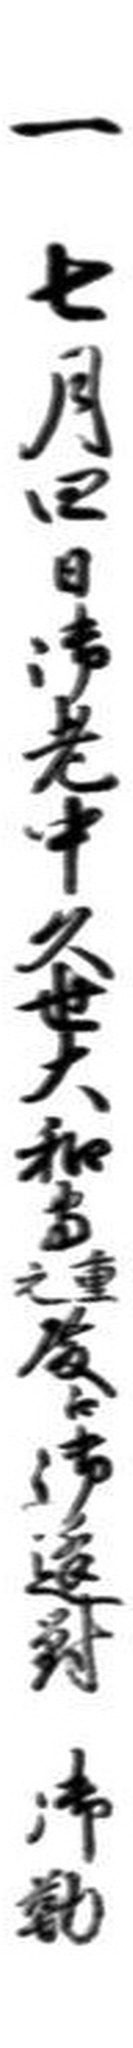一七月四日御老中久世大和守重之殿江御逢対御勤

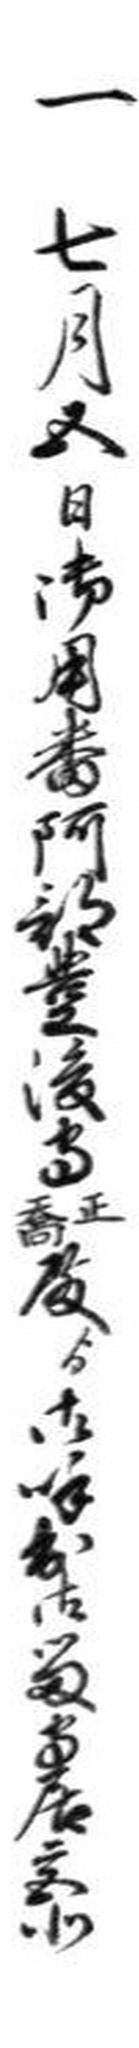一七月五日御用番阿部豊後守正喬殿ゟ御呼出御留守居宮北
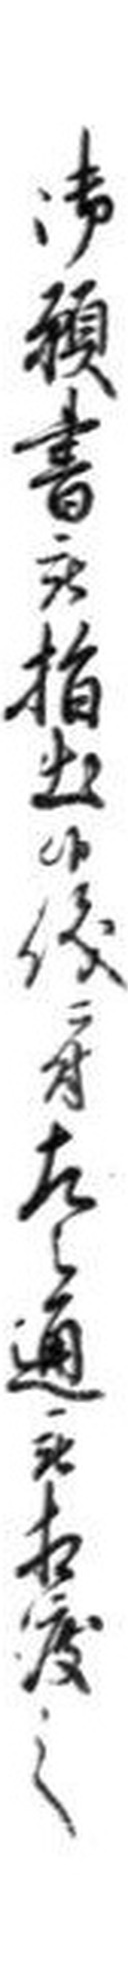御願書被指出候儀ニ付左之通被相渡之
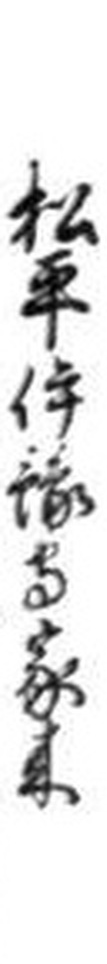松平伊予守家来
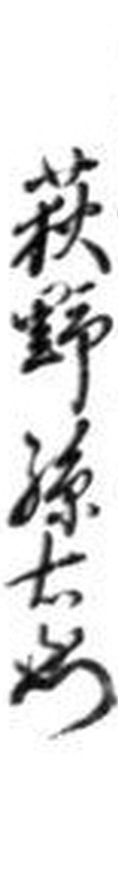荻野孫右衛門
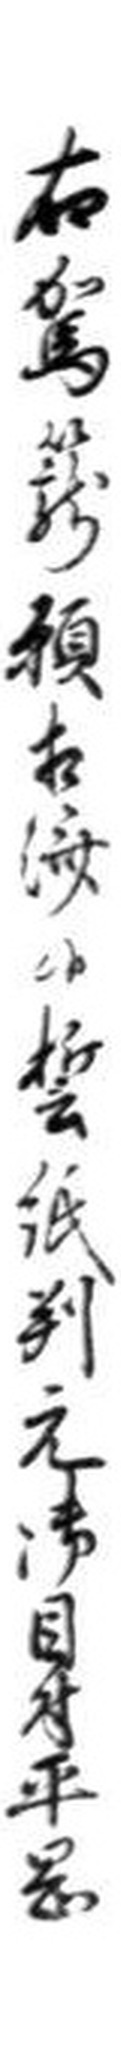右駕籠願相済候誓紙班判元御目付平岡
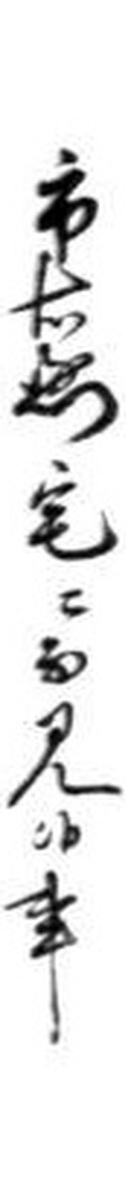市右衛門宅ニ而見候事
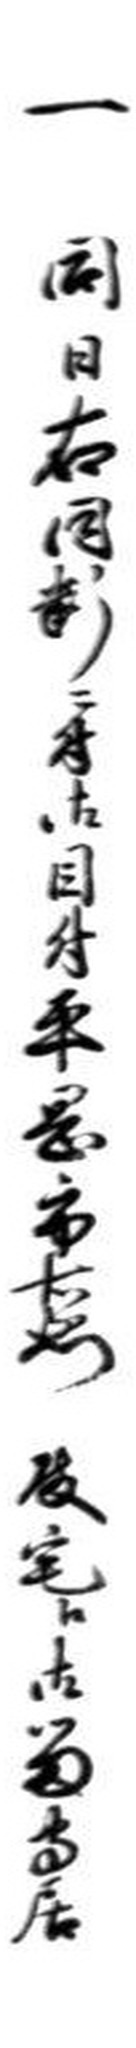一同日右同断ニ付御目付平岡市右衛門殿宅江御留守居
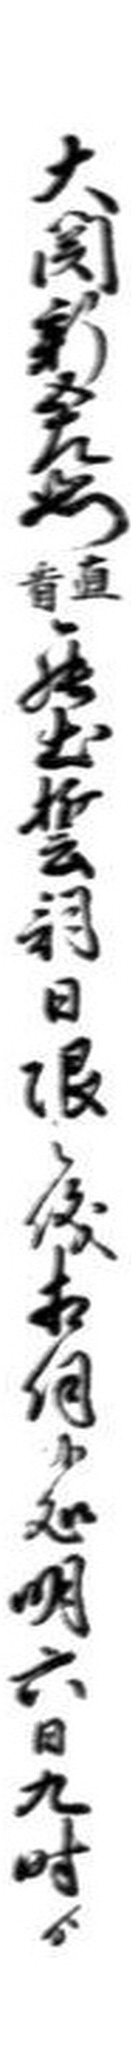大関新五左衛門直看罷出誓詞日限之儀相伺候処明六日九時ゟ
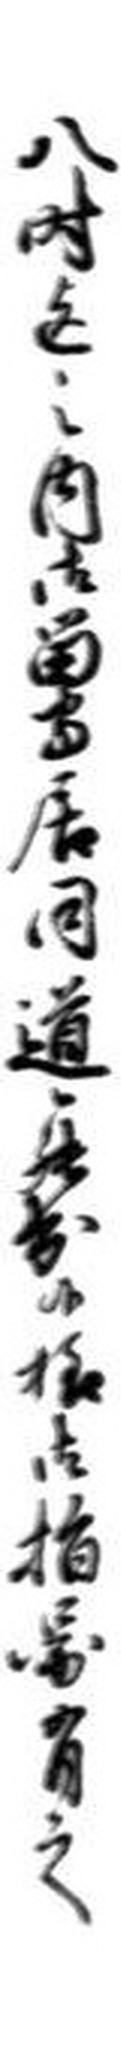八時迄之内御留守居同道罷出候様御指図有之
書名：家譜 三十一 吉邦公 享保元年
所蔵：福井県文書館 Fukui Prefectural Archives
